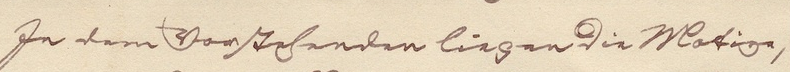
In dem Vorstehenden liegen die Motive,
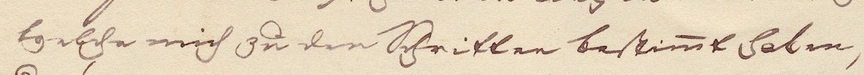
welche mich zu den Schritten bestimmt haben,
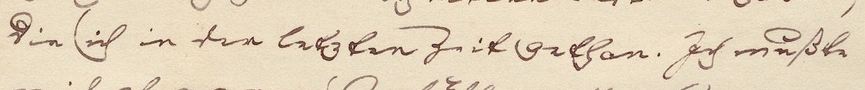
die ich in der letzten Zeit gethan. Ich mußte
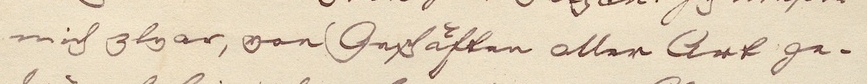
mich zwar, von Geschäften aller Art ge-
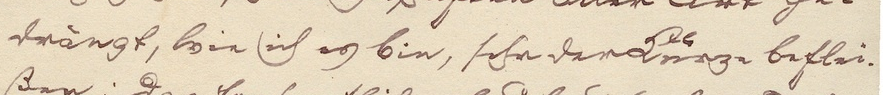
drängt, wie ich es bin, sehr der Kürze beflei-
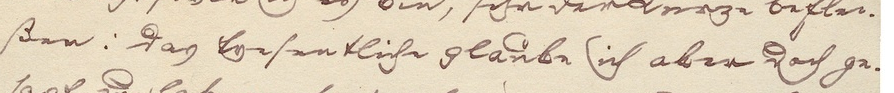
ßen: das wesentliche glaube ich aber doch ge-
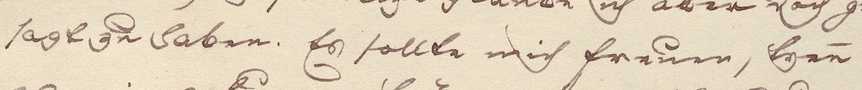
sagt zu haben. Es sollte mich freuen, wenn
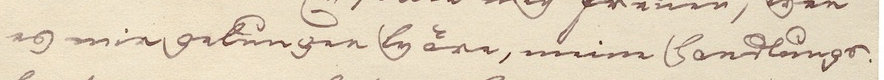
es mir gelungen wäre, meine Handlungs-
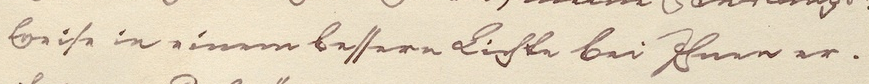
weise in einem bessern Lichte bei Ihnen er-
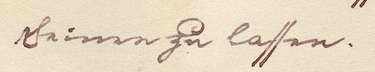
scheinen zu lassen.
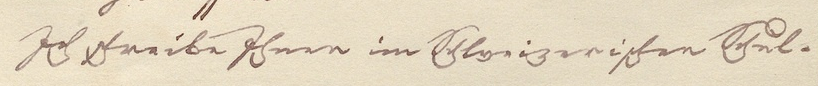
Ich schreibe Ihnen im Schweizerischen Schul-
